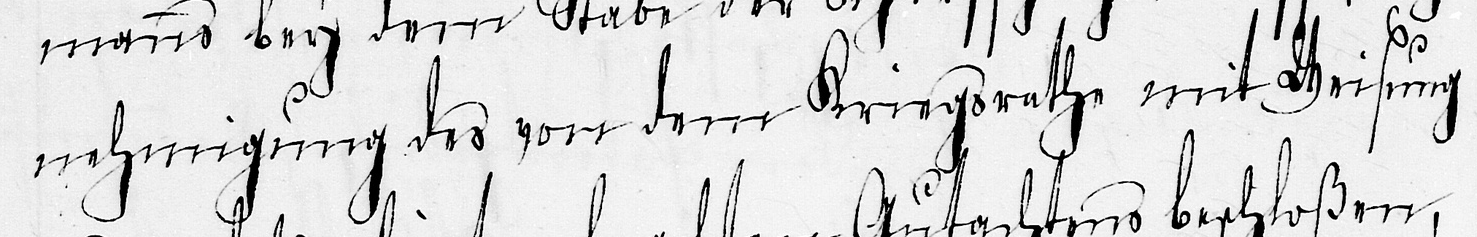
nehmigung des von dem Kriegsrathe mit Weisung
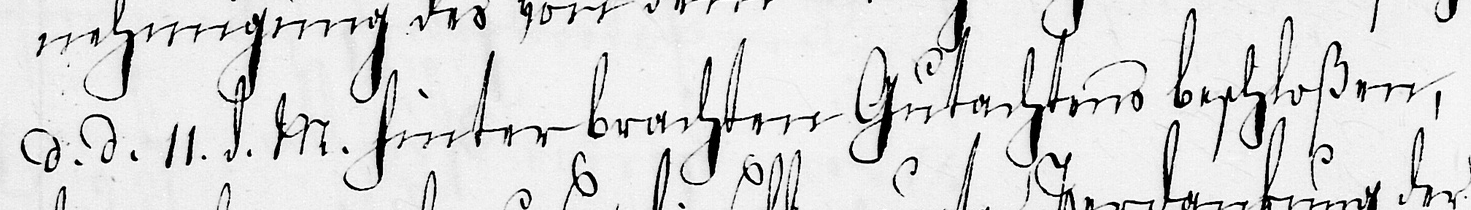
d. d. 11. d. M. hinterbrachten Gutachtens beschloßen,
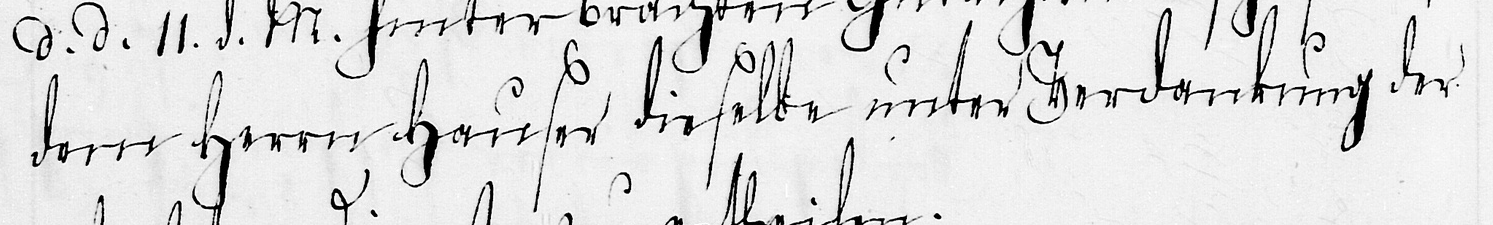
dem Herrn Hauser dieselbe unter Verdankung der
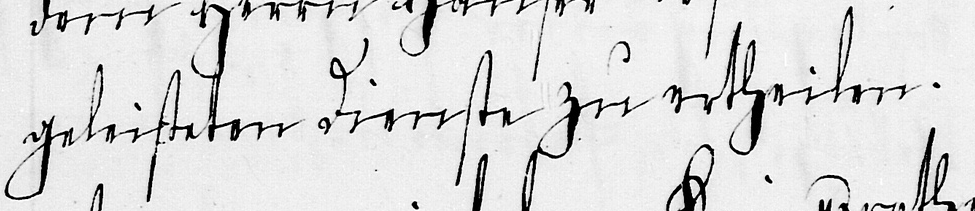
geleisteten Dienste zu ertheilen.
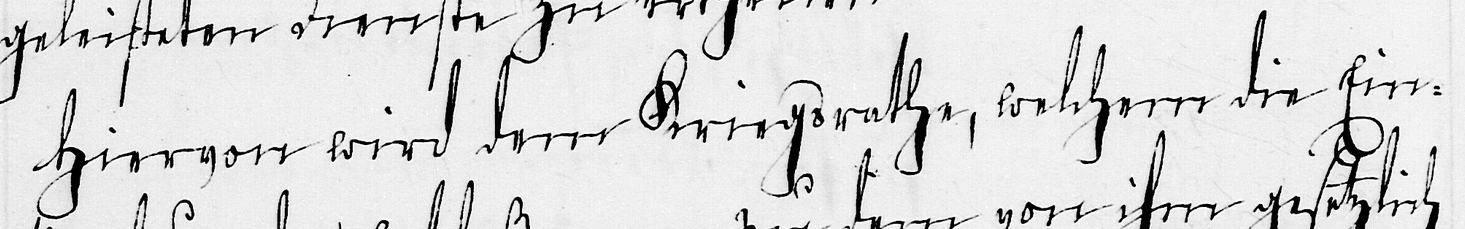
Hiervon wird dem Kriegsrathe, welchem die Ein¬
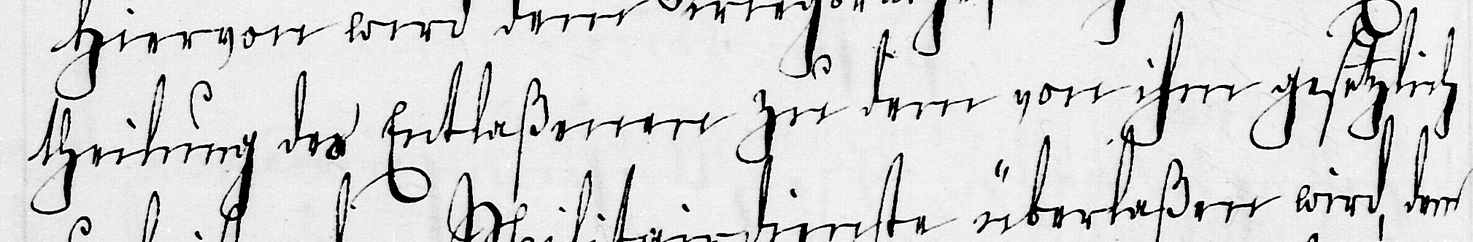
theilung des Entlaßenen zu dem von ihm gesetzli¬
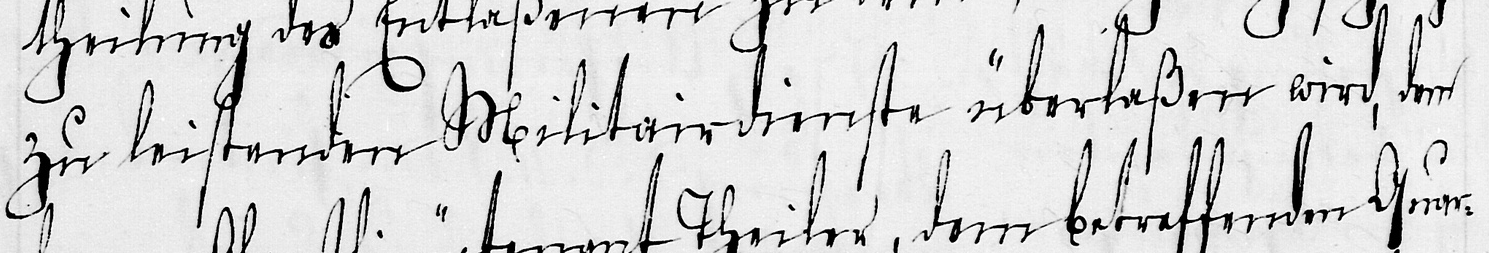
zu leistenden Militairdienste überlaßen wird, dem
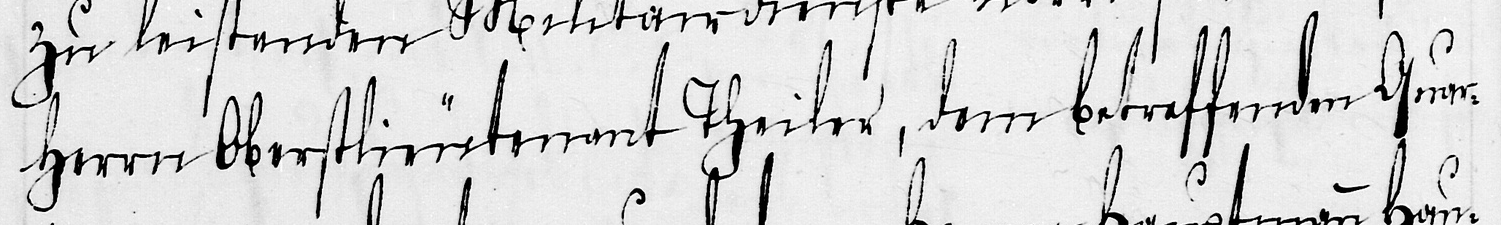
Herrn Oberstlieutenant Theiler, dem betreffenden Qu¬
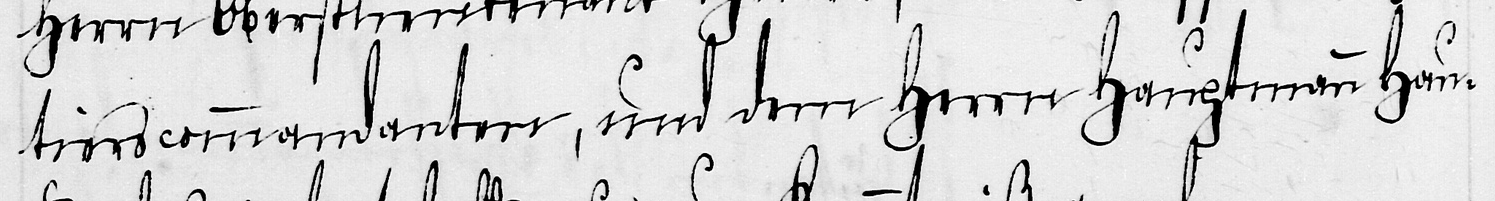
tierscommandanten, und dem Herrn Hauptmann Hau¬
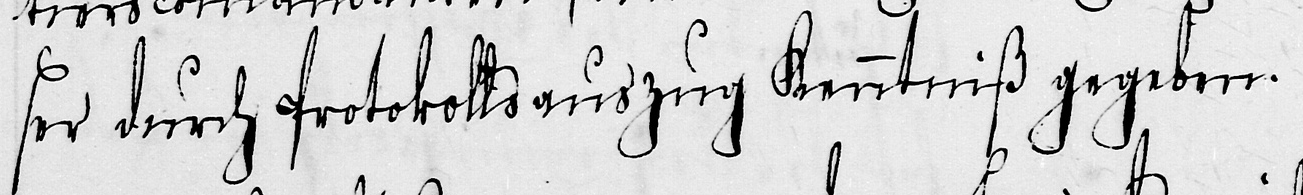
ser durch Protokollsauszug Kenntniß gegeben.
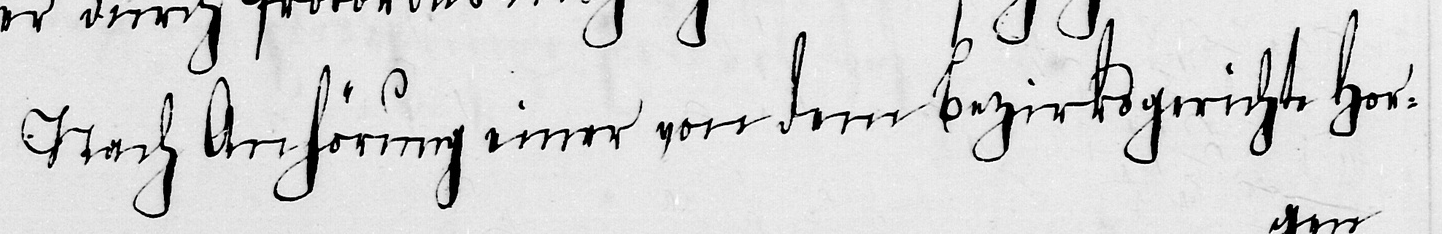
Nach Anhörung einer von dem Bezirksgerichte Hor-
